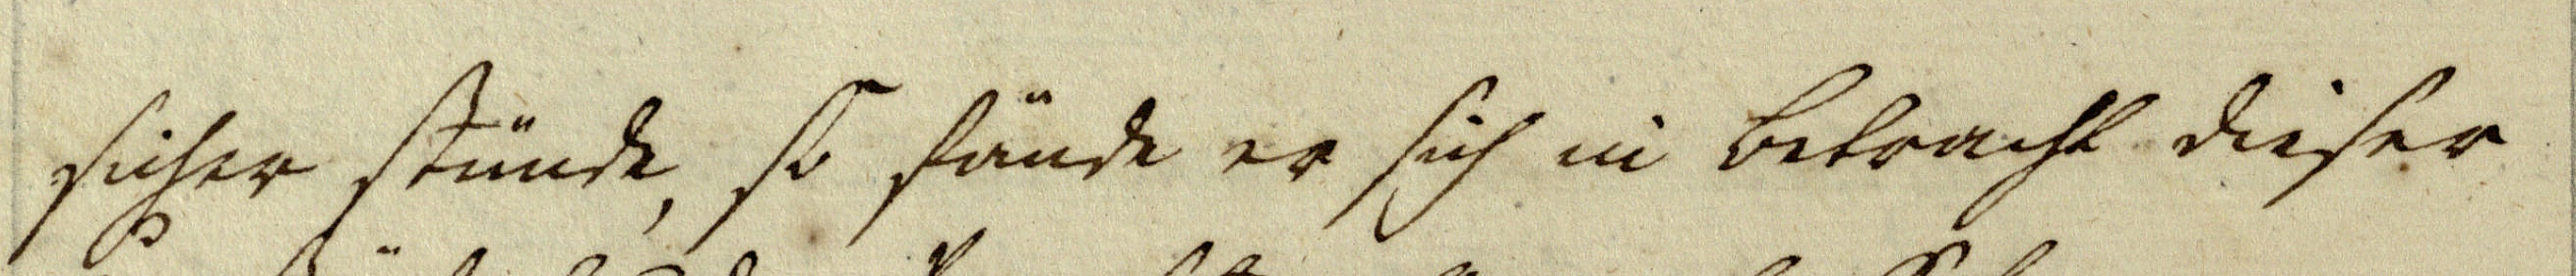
sicher stünde, so fände er sich in Betracht dieser
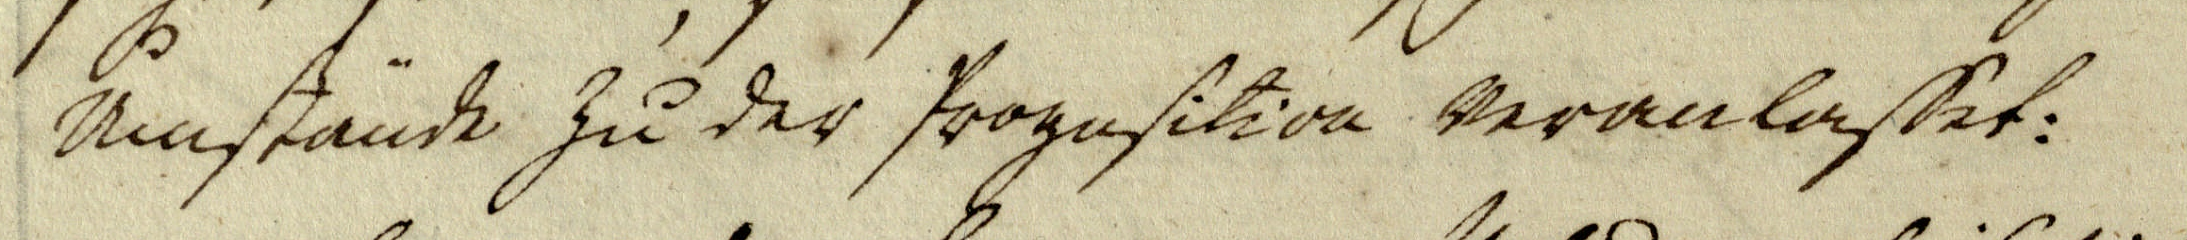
Umstände zu der Proposition veranlasset:
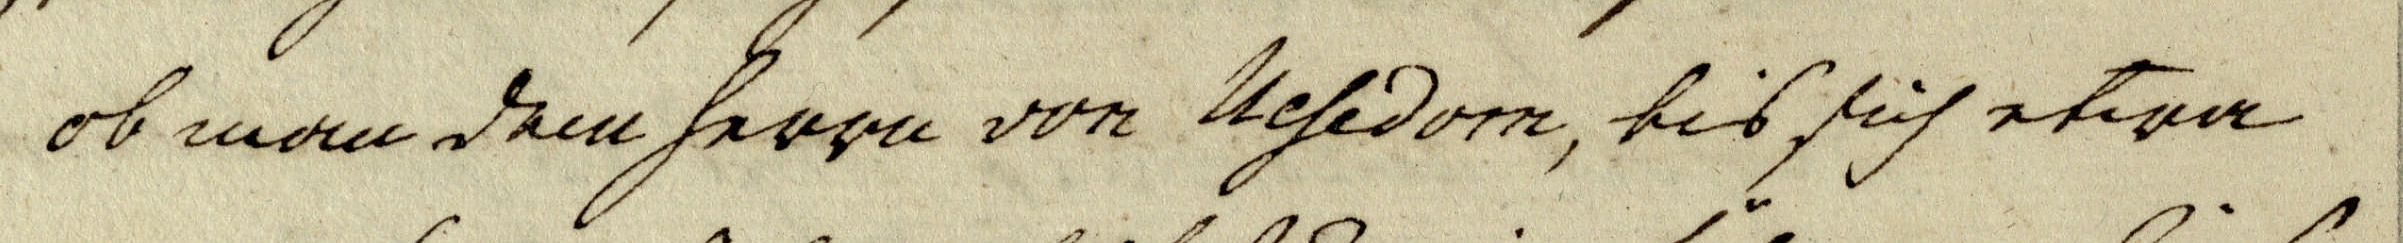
ob man dem Herrn von Uesedom, bis sich etwa
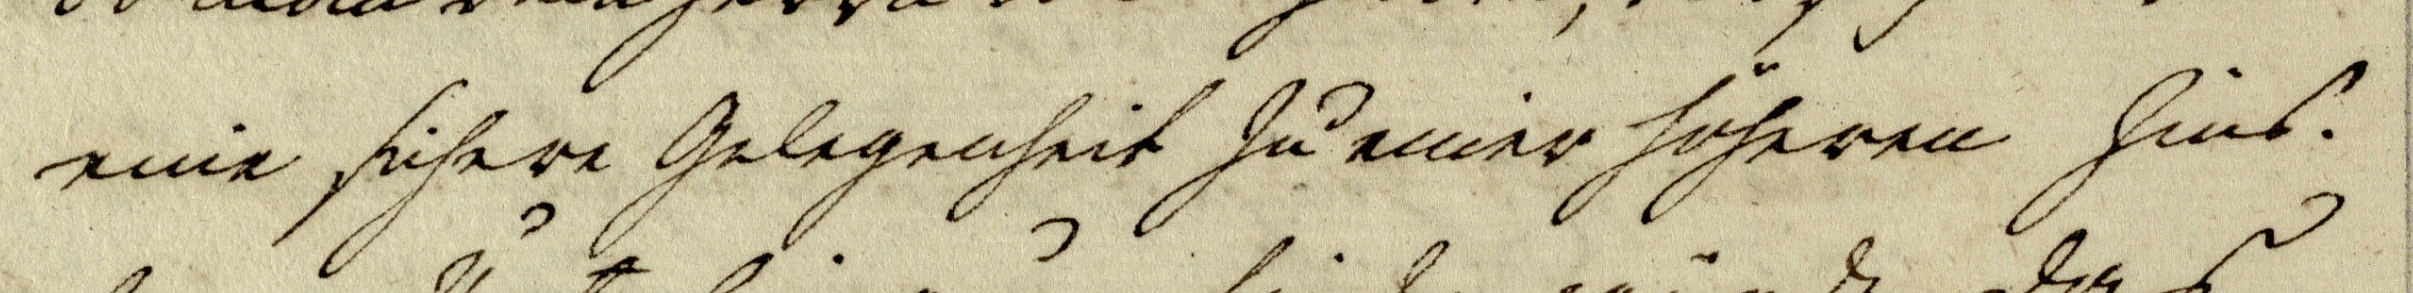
eine sichere Gelegenheit zu einer höheren Zins¬
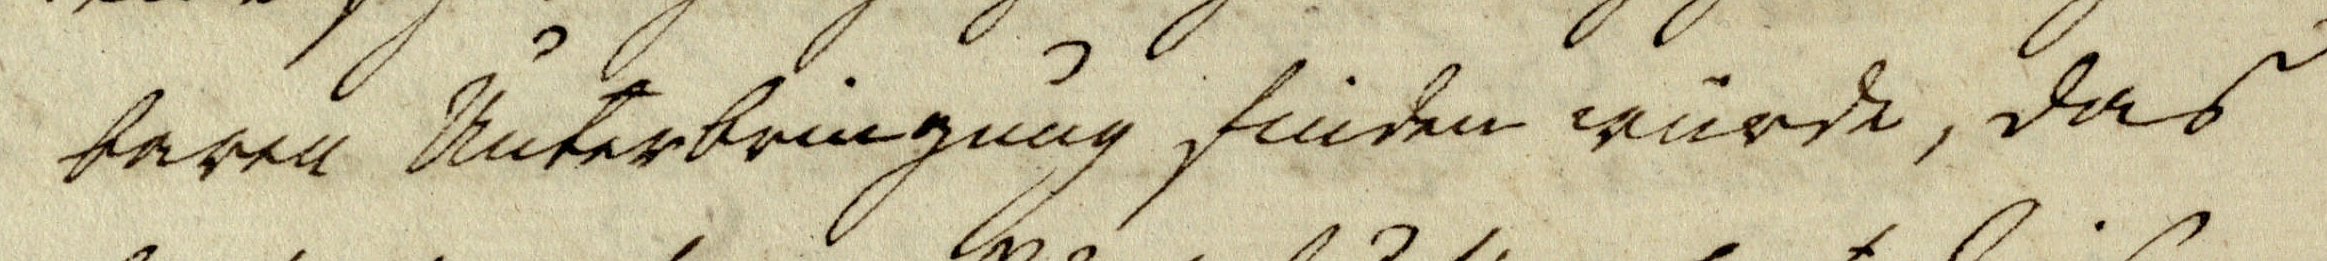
baren Unterbringung finden würde, das
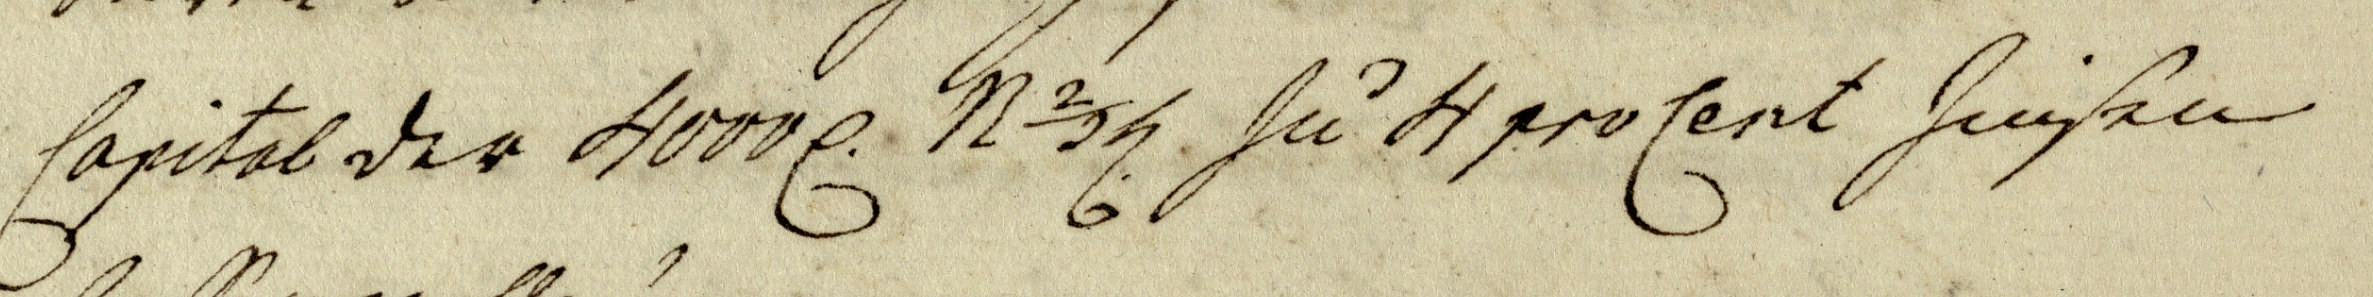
Capital der 4000 l. N ¾ h. zu 4 pro Cent Zinsen
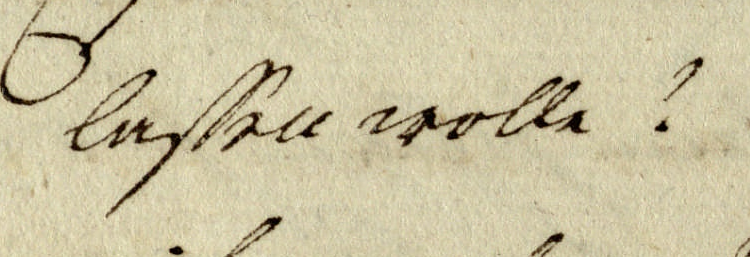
lassen wolle?
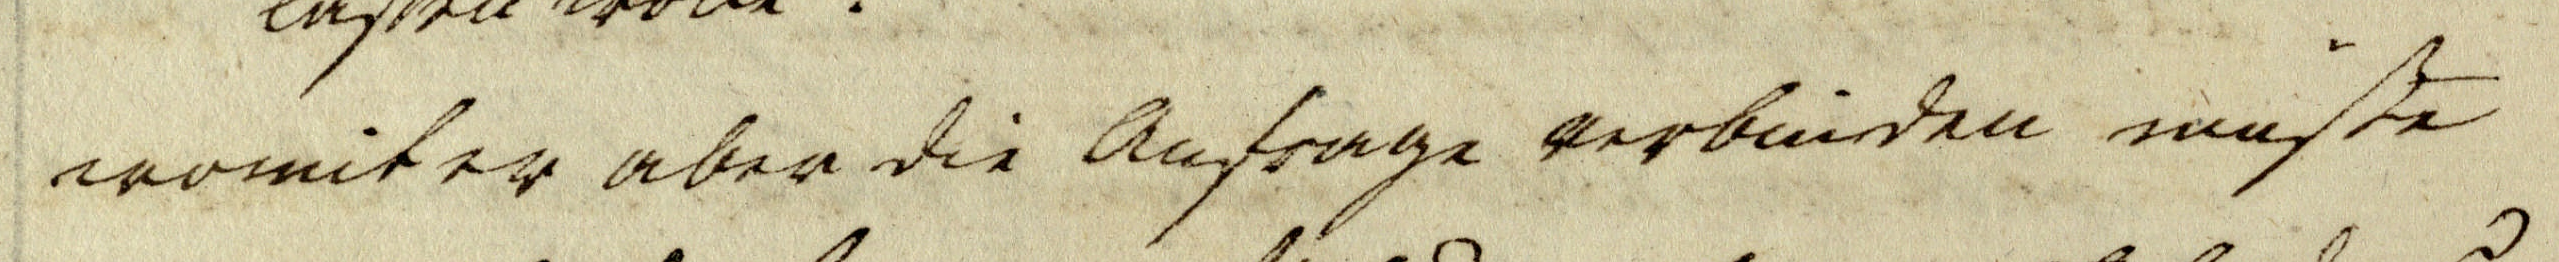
womit er aber die Anfrage verbinden müßte
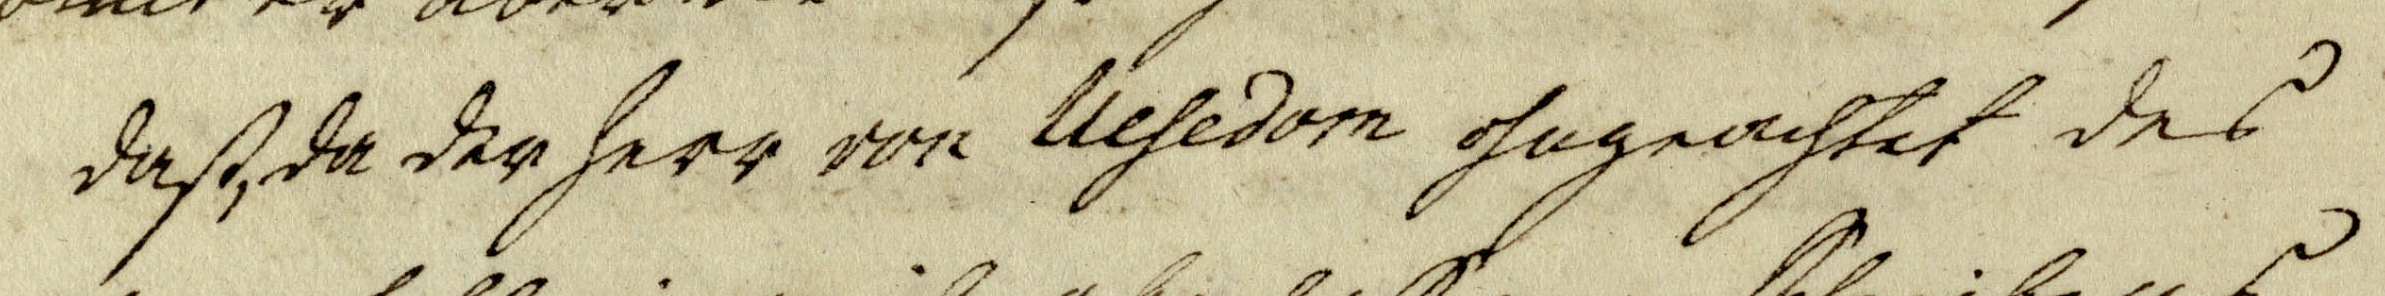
daß, da der Herr von Uesedom ohngeachtet des
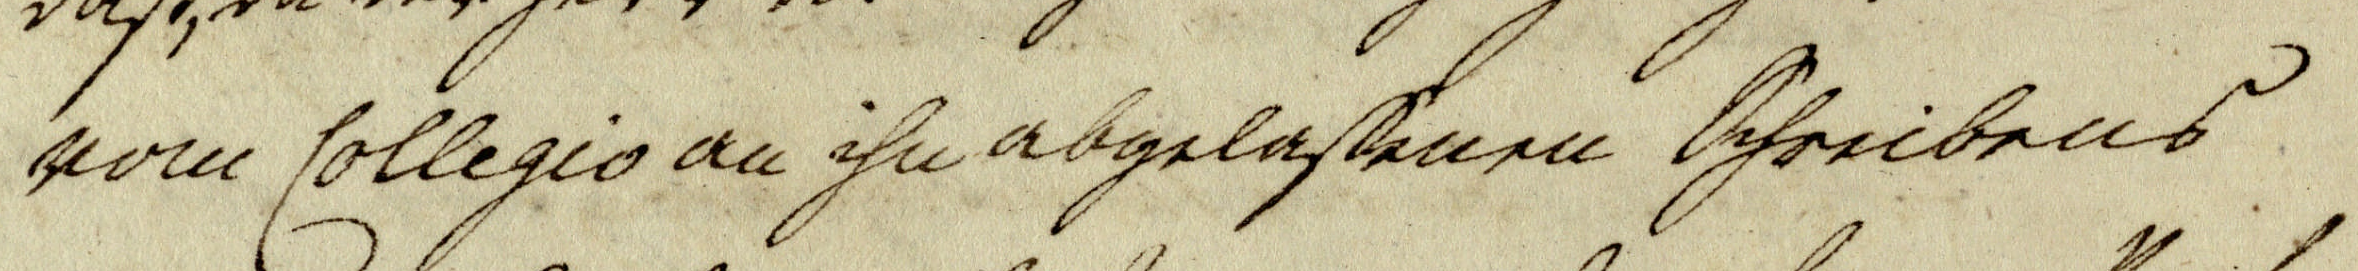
vom Collegio an ihn abgelassenen Schreibens
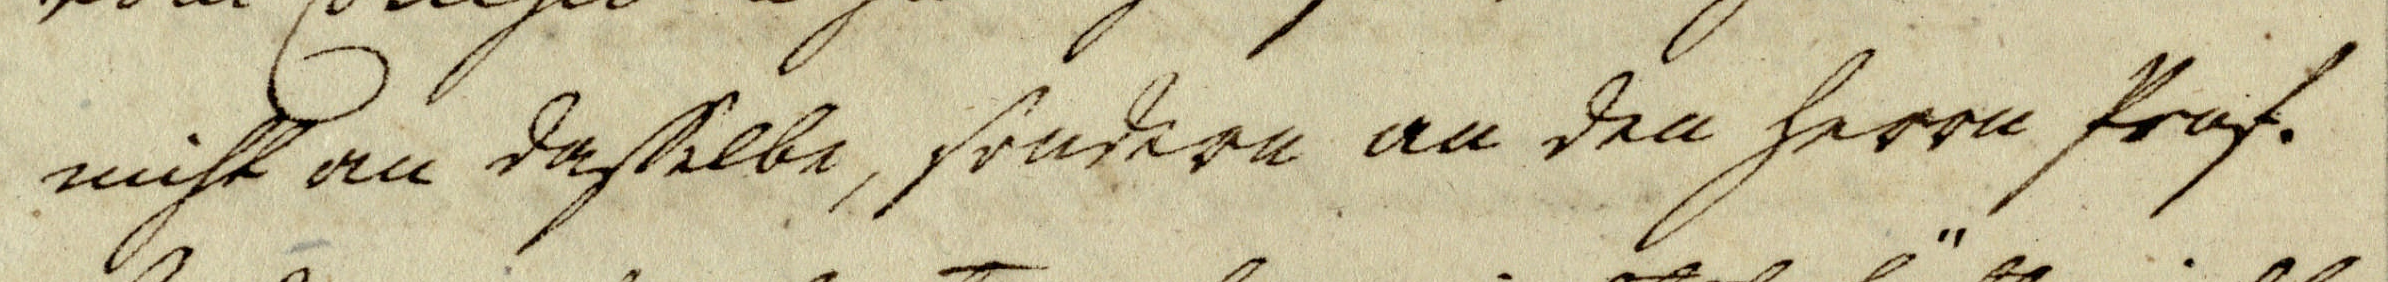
nicht an dasselbe, sondern an den Herrn Prof.
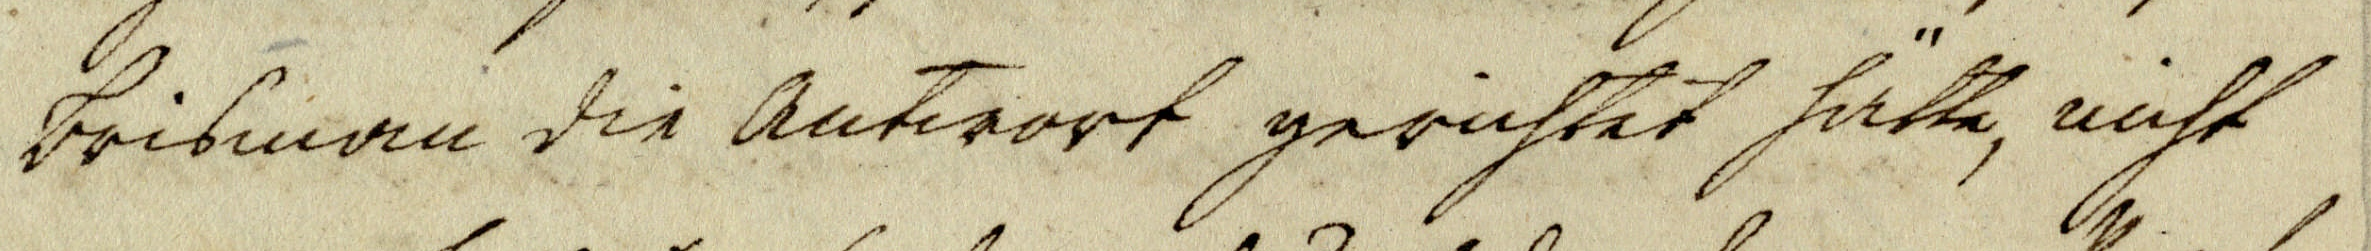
Brisman die Antwort gerichtet hätte, nicht
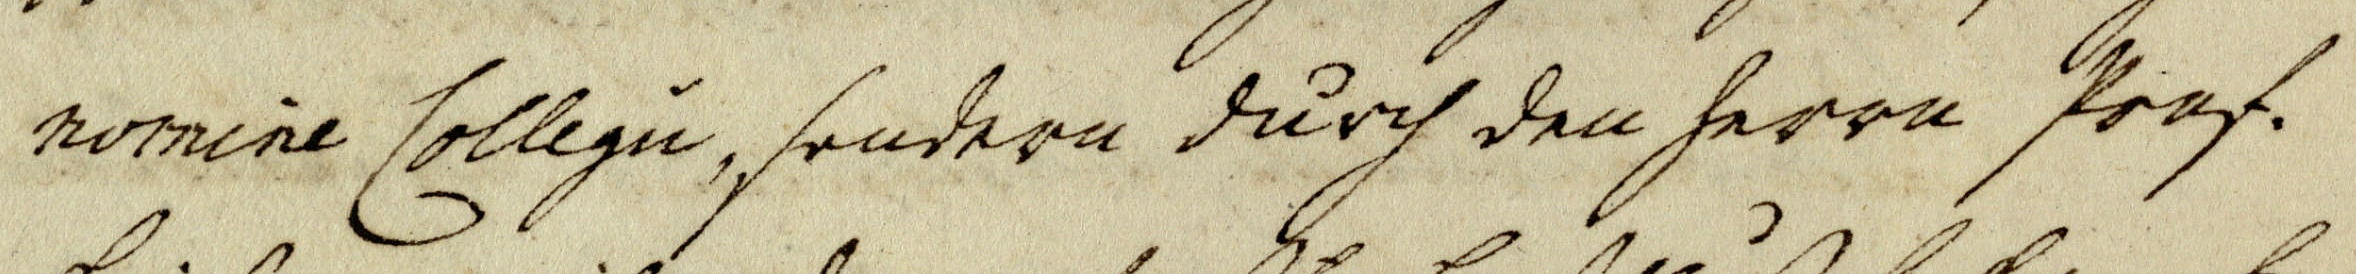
nomine Collegii, sondern durch den Herrn Prof.
